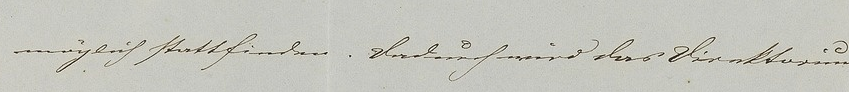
möglich stattfinden. Dadurch wird das Direktorium
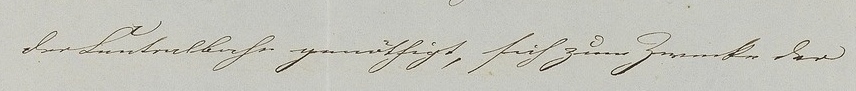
der Centralbahn genöthigt, sich zum Zwecke der
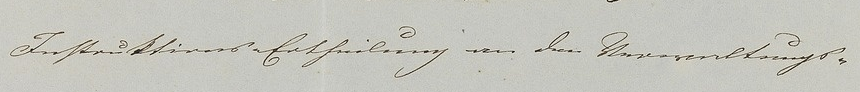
Instruktions-Ertheilung an den Verwaltungs-
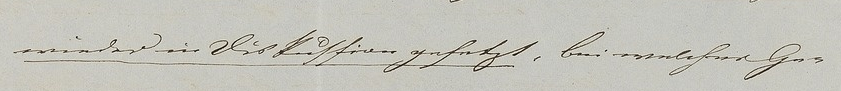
wieder in Diskussion gesetzt, bei welcher Ge-
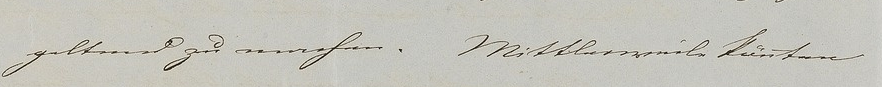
geltend zu machen. Mittlerweile könnten
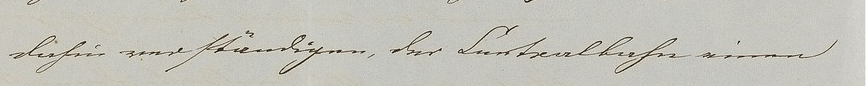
dahin verständigen, der Centralbahn einen
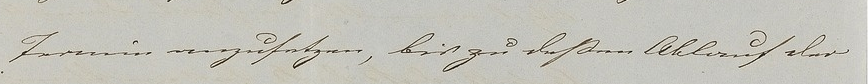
Termin anzusetzen, bis zu deßen Ablauf der
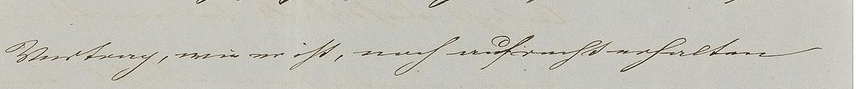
Vertrag, wie er ist, noch aufrecht erhalten
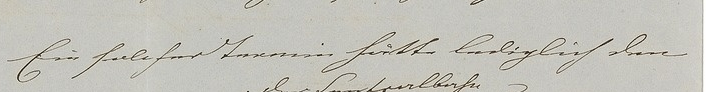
Ein solcher Termin hätte lediglich den
